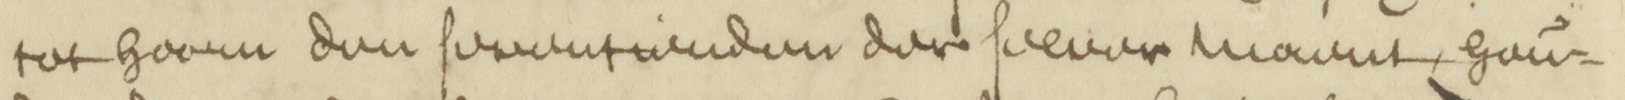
tot Hoorn den seventienden der selver maent, hou„
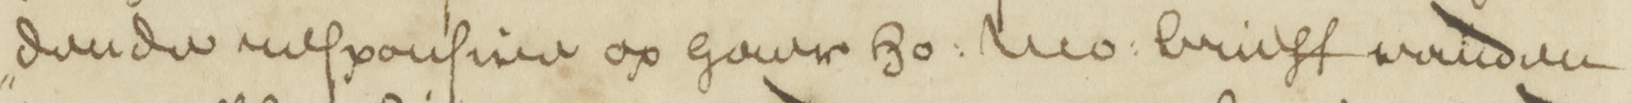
,,dende responsive op haer Ho:Mo: brieff vanden
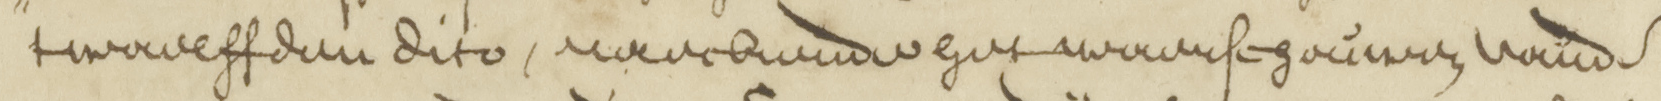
twaelffden dito, raeckende het waerschouwen vande
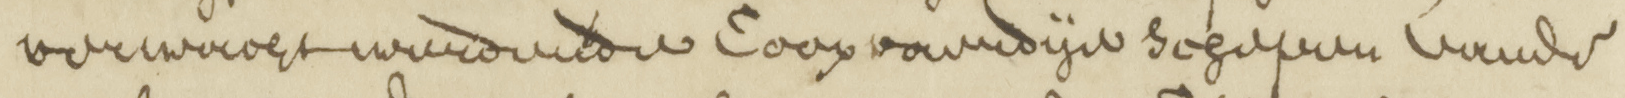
verwacht werdende Coopvaerdije schepen vande
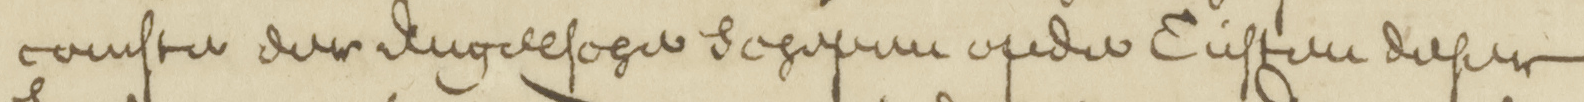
comste der Engelsche schepen opde Custen deser
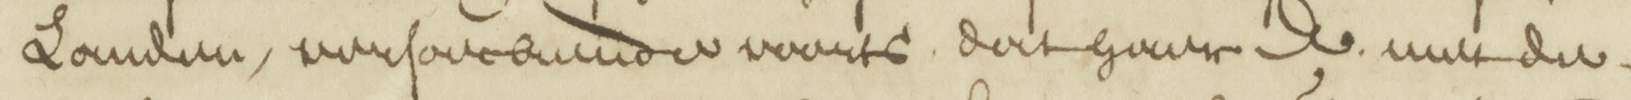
Landen, versoeckende voorts dat haer E. met de
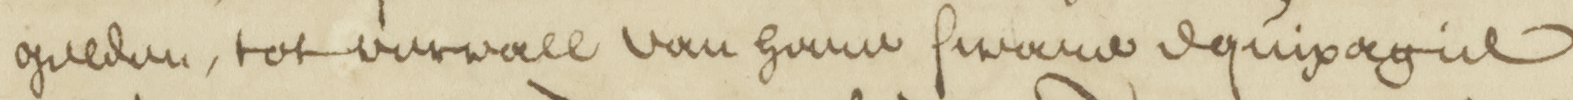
gelden, tot vervall van heure sware equipagie
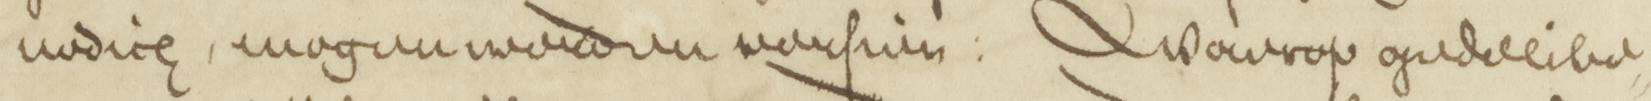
nodich, mogen werden versien: Waerop gedelibe„
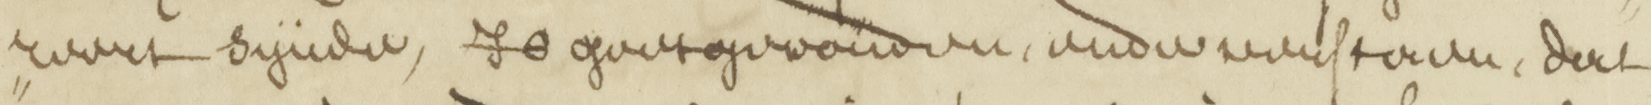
,,reert sijnde, Is goetgevonden, ende verstaen, dat
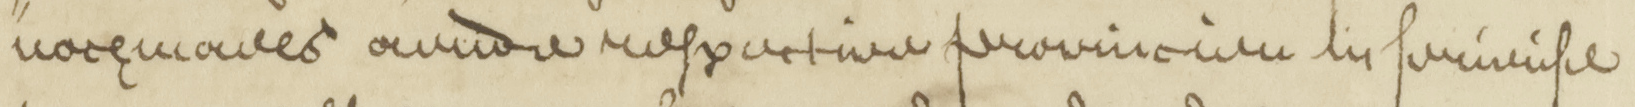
nochmaels aende respective provincien in serieuse
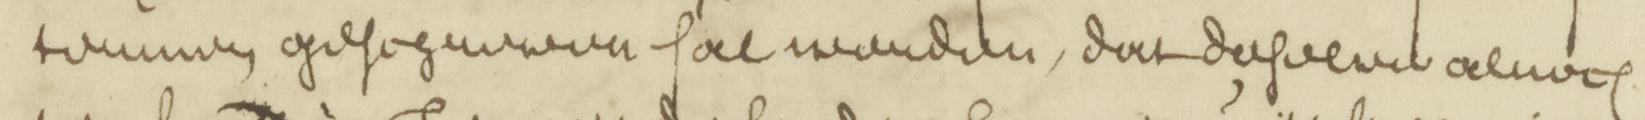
termen geschreven sal werden, dat deselve alnoch
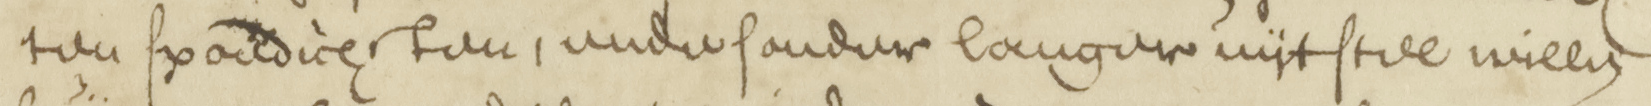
ten spoedichsten, ende sonder langer uijtstel willen
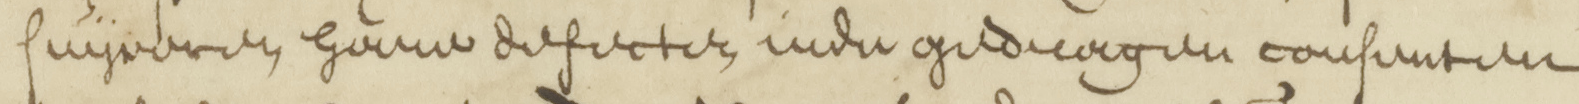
suijveren hare defecten inde gedragen consenten
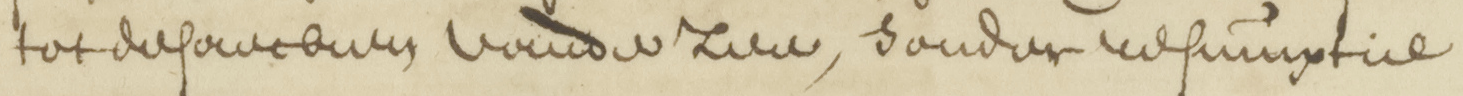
tot de saecken vande Zee, sonder resumptie.
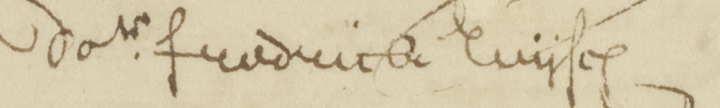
Dor Fredrick Ruijsch
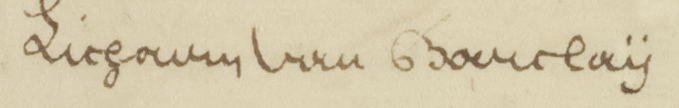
Lichaem van Barclaij
